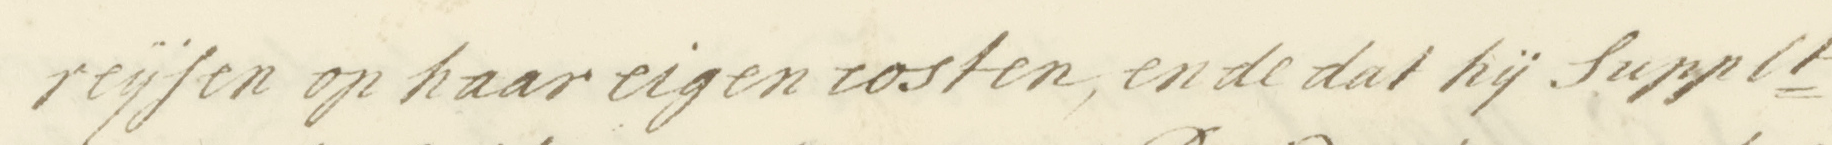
reijsen op haar eigen costen, ende dat hij supplt
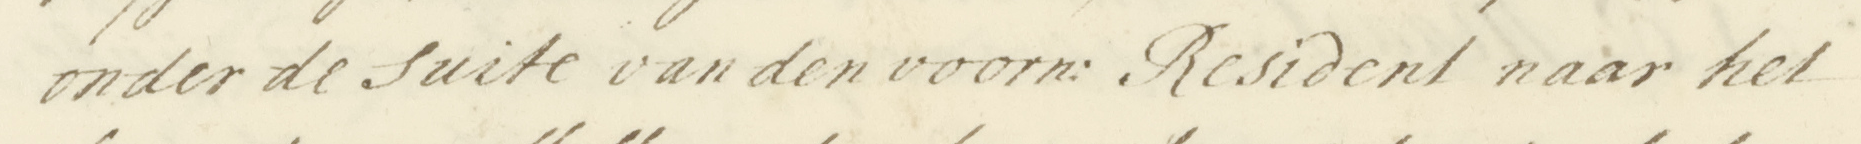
onder de suite van den voorn: Resident naar het
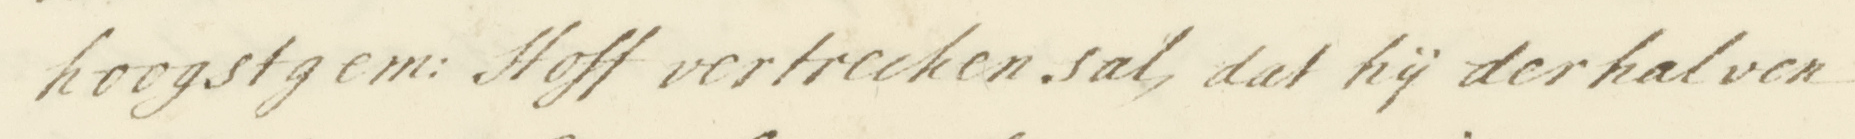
hoogst gem: Hoff vertrecken sal, dat hij derhalven
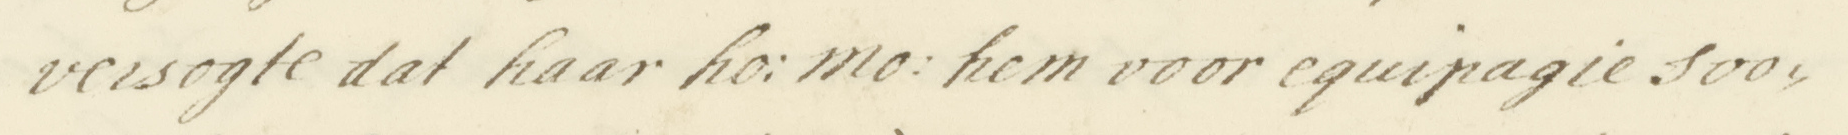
versogte dat haar ho:mo: hem voor equipagie soo,,
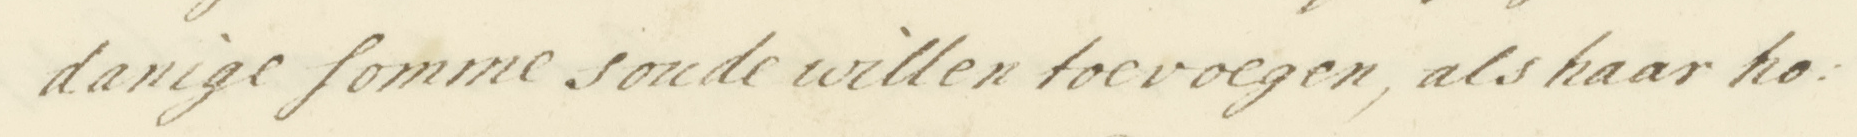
danige somme soude willen toevoegen, als haar ho:
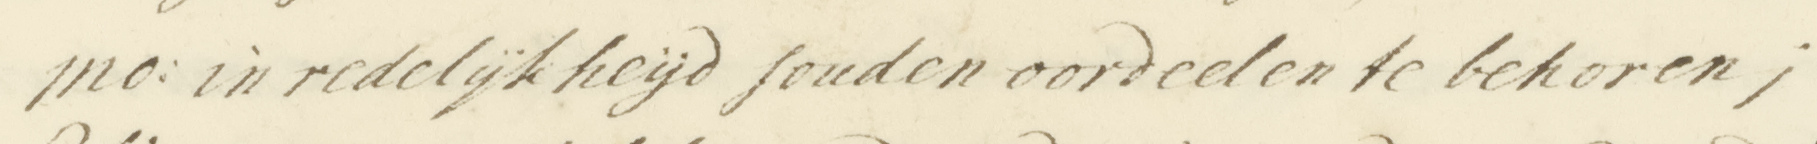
mo: in redelijkheijd souden oordeelen te behoren;
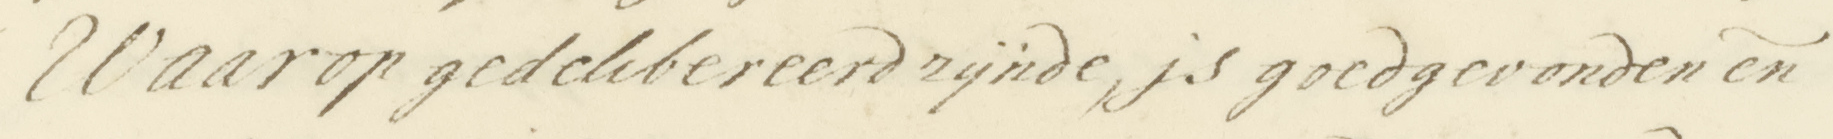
Waarop gedelibereerd zijnde, is goedgevonden en
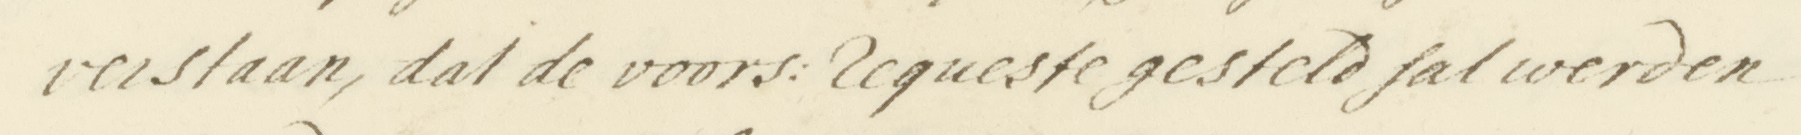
verstaan, dat de voors: requeste gesteld sal werden
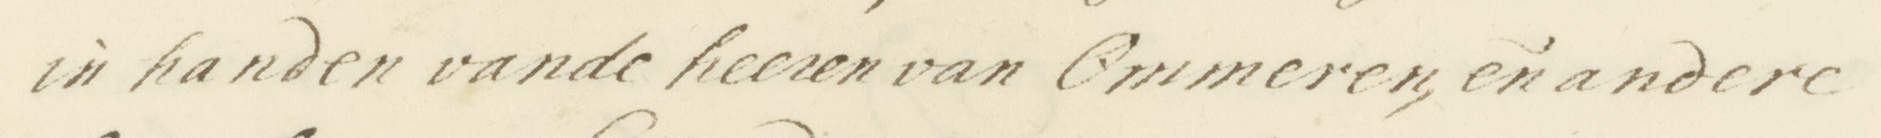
in handen vande heeren van Ommeren, en andere
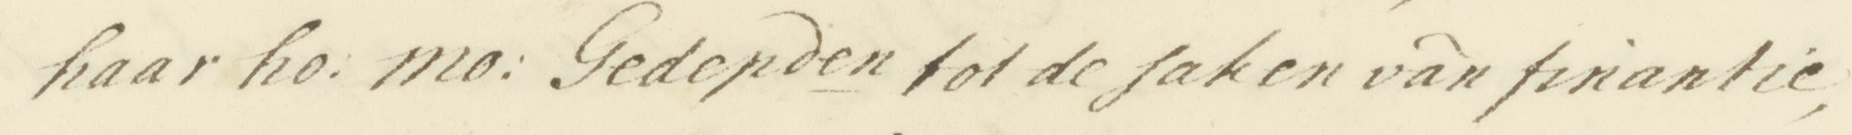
haar Ho:Mo: Gedepden tot de saken van finantie,
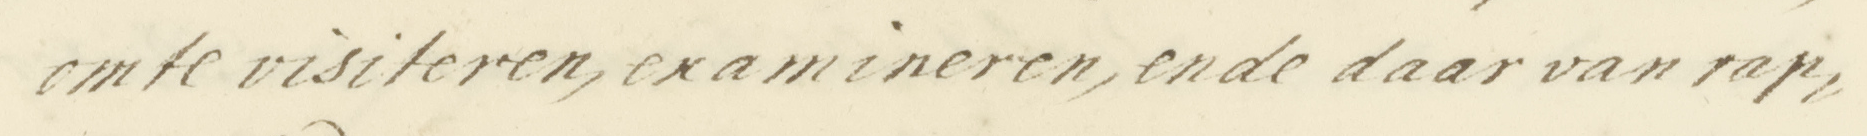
om te visiteren, examineren, ende daar van rap,,
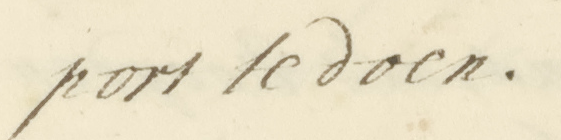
port te doen.
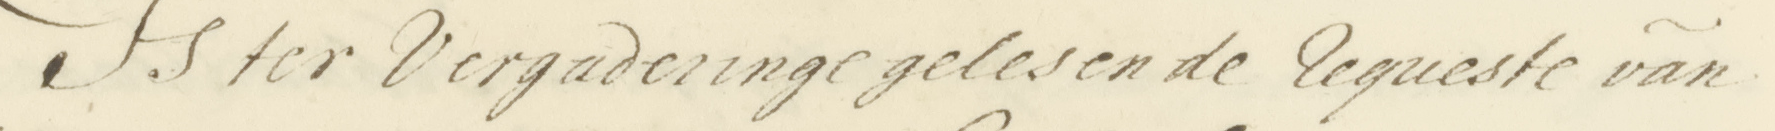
Is ter vergaderinge gelesen de requeste van
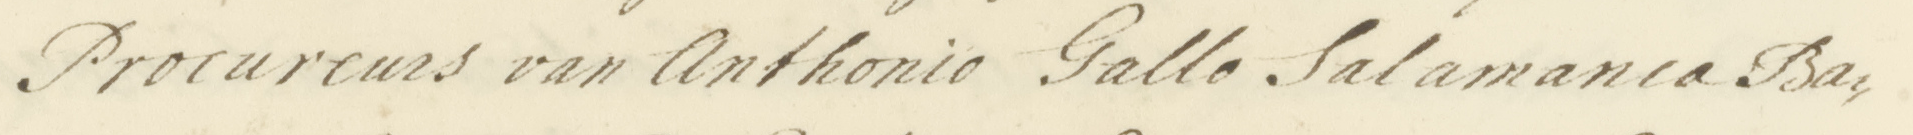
Procureurs van Anthonio Gallo Salamanca Ba,,
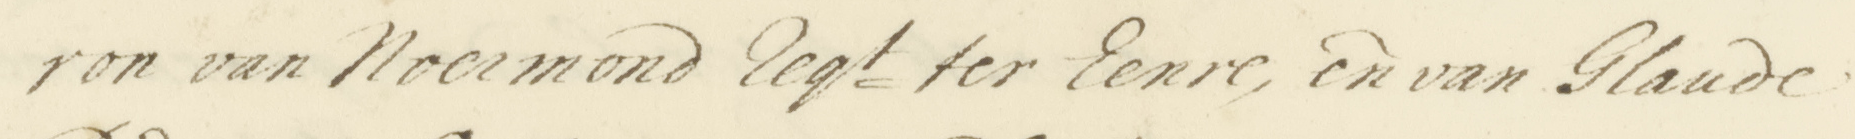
ron van Roermond reqt. ter Eenre, en van Glaude
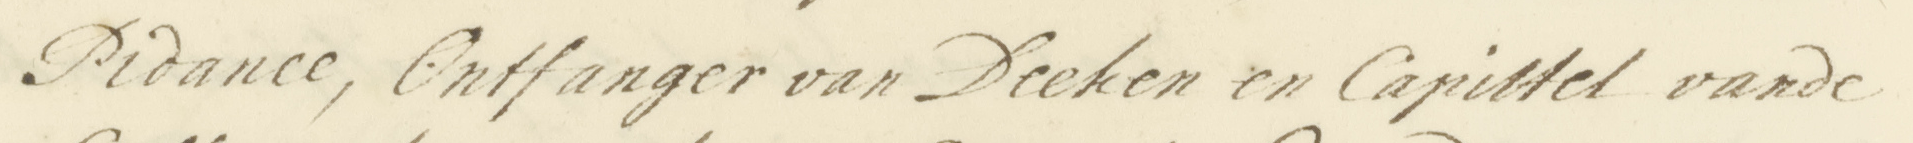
Pidance, Ontfanger van Deeken en Capittel vande
